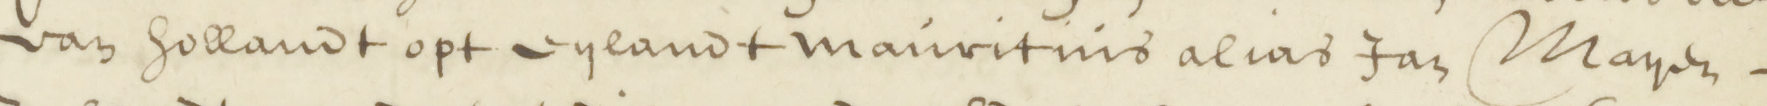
van Hollandt opt eylandt Mauritius alias Jan Mayen
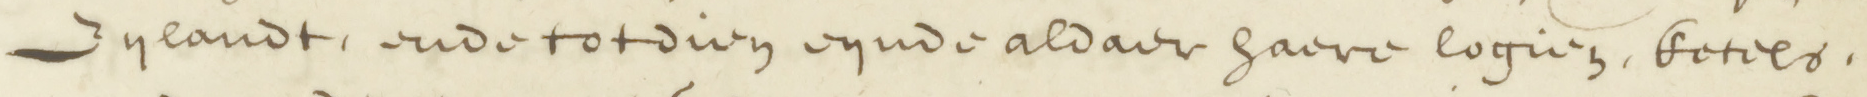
Eylandt, ende totdien eynde aldaer haere logien, ketels
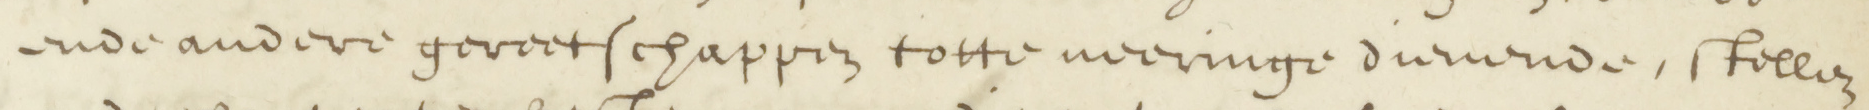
ende andere gereetschappen totte neeringe dienende, stellen
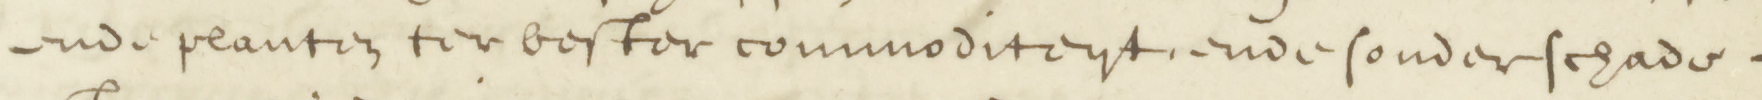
ende planten ter bester commoditeyt ende sonder schade
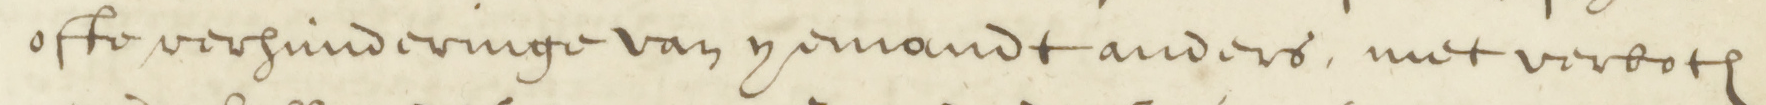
ofte verhinderinge van yemandt anders met verboth
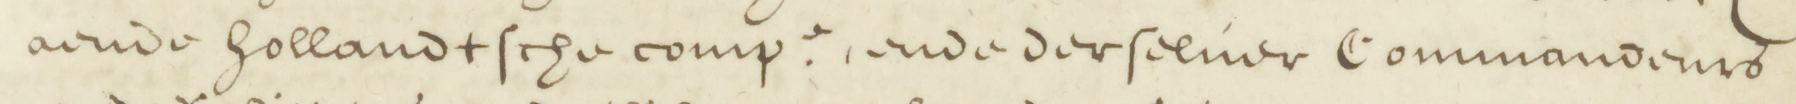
aende Hollandtsche compe, ende derseluer Commandeurs
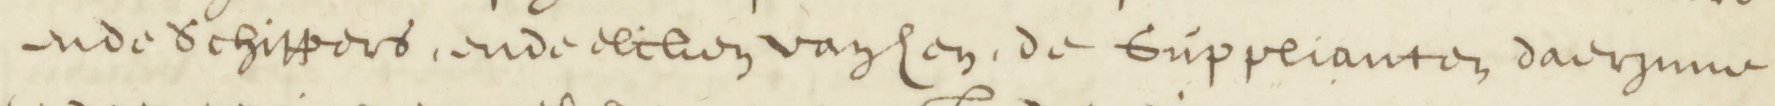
ende schippers, ende elcken van hen, de supplianten daerinne
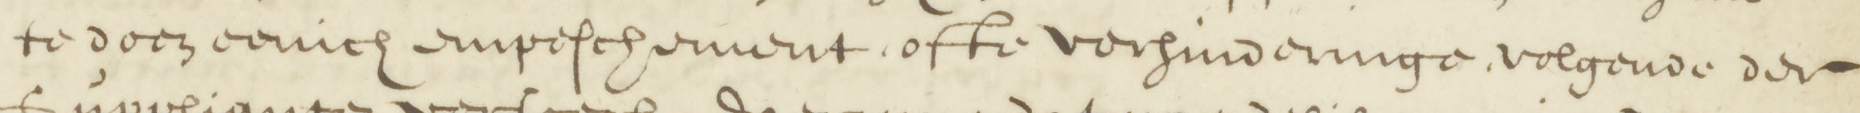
te doen eenich empeschement, ofte verhinderinge volgende der
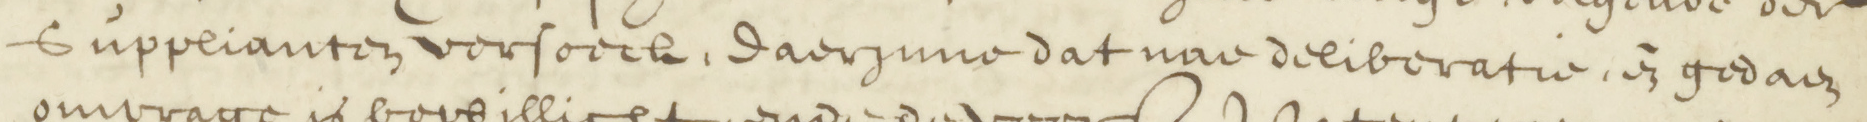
supplianten versoeck, daerinne dat nae deliberatie, en gedaen
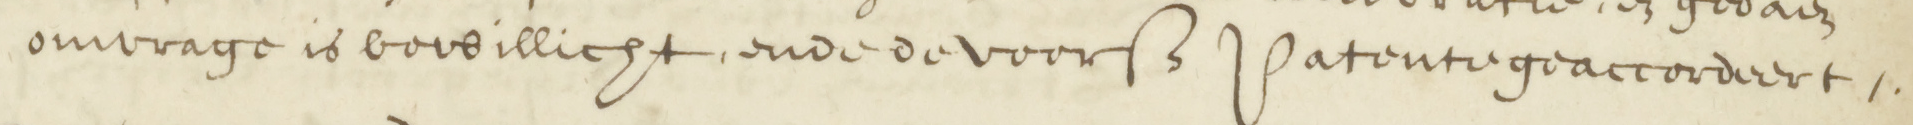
omvrage is bewillicht, ende de voors patente geaccordeert.
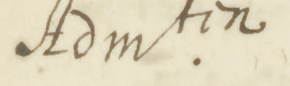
Admten
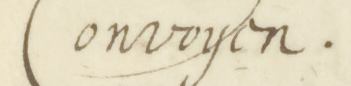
Convoyen.
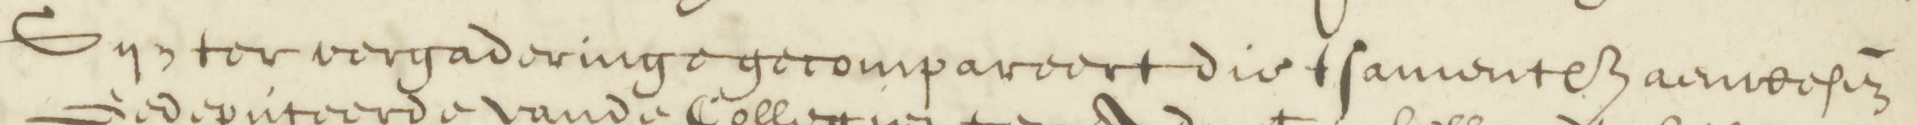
Syn ter vergaderinge gecompareert die tsamentl aenwesen
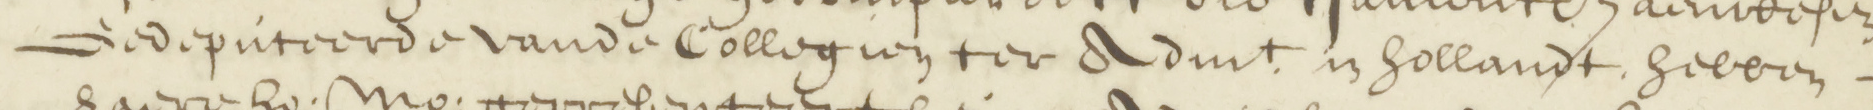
Gedeputeerde vande Collegien ter Admt in Hollandt, hebben
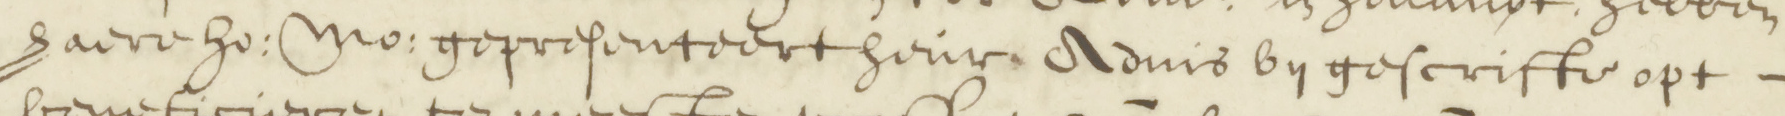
haere Ho:Mo: gepresenteert heur Aduis by gescrifte opt
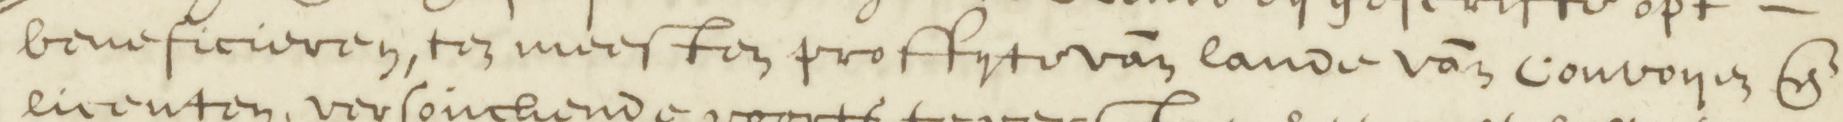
beneficieren, ten meesten proffyt van lande van convoyen &
